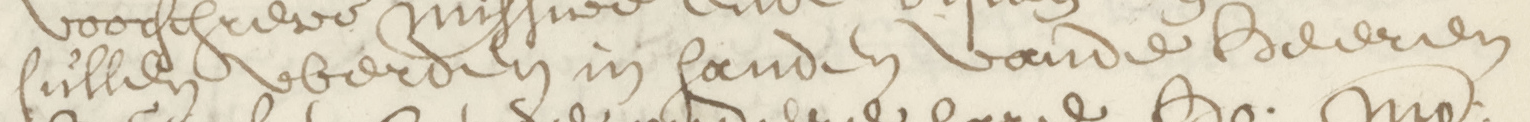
sullen werden in landen vande Heeren
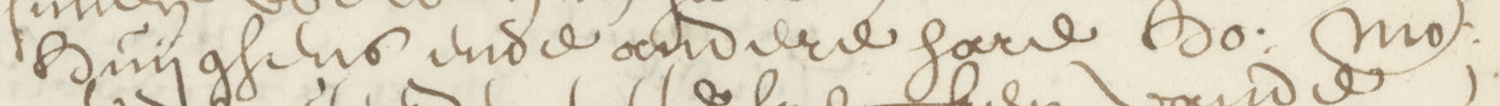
Huijghens ende andere hare Ho:Mo:
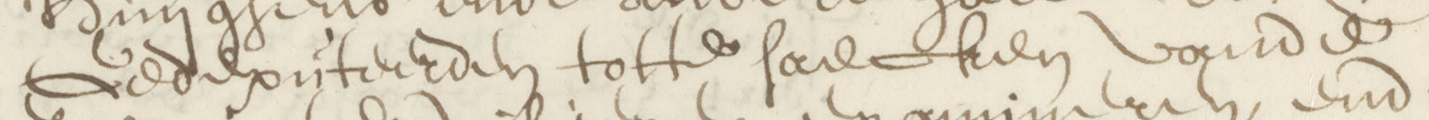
Gedeputeerden totte saecken vande
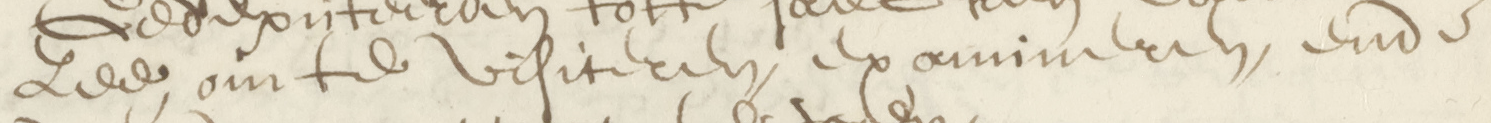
Zee om te visiteren, examineren, ende
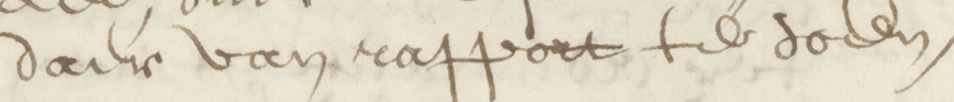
daer van rapport te doen.
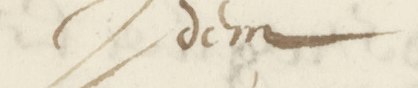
Idem
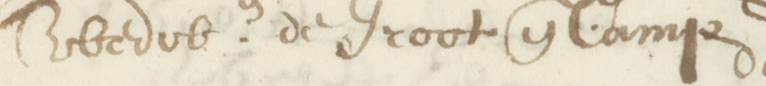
Wedwen. de Groot & Campen
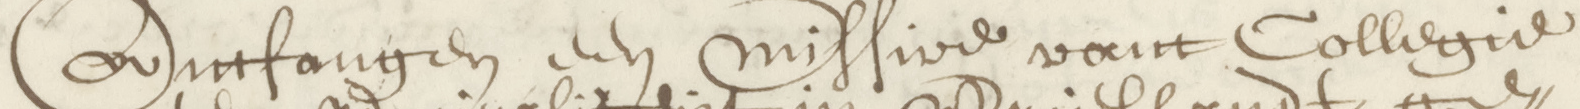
Ontfangen een missive vant Collegie
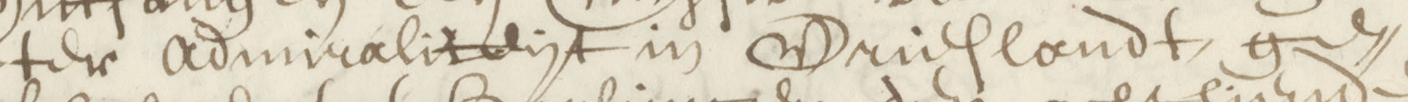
ter Admiraliteijt in Vrieslandt, ge,,
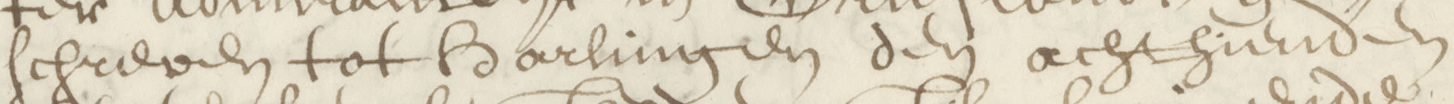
schreven tot Harlingen den achthienden
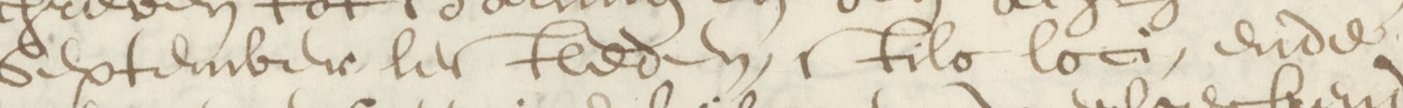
September lestleden, stilo loci, ende
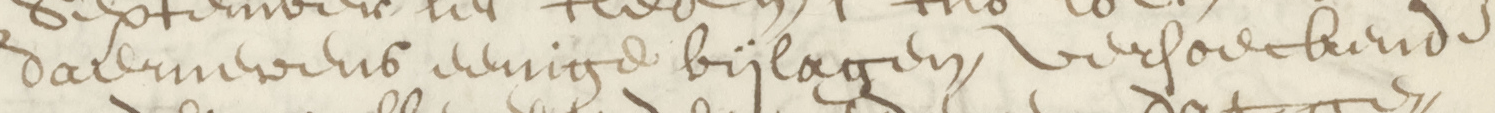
daernevens eenige bijlagen, versoeckende
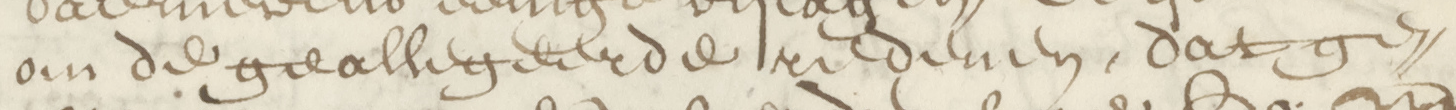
om de geallegeerde redenen, dat ge,,
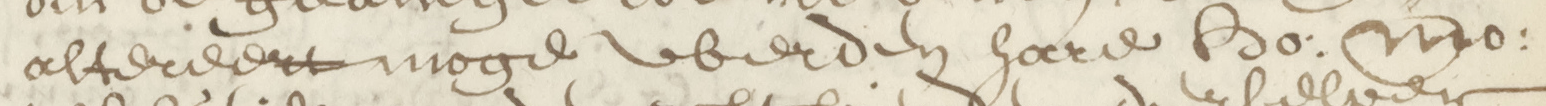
altereert moge werden hare ho:Mo:
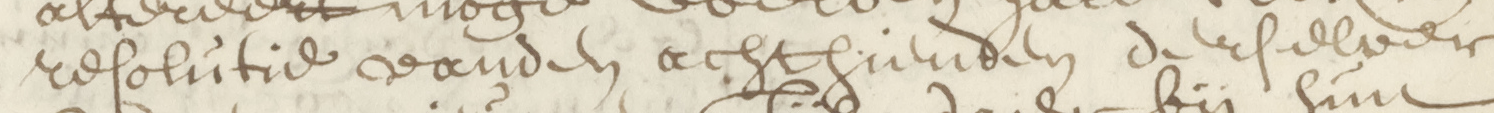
resolutie vanden achthienden derselver
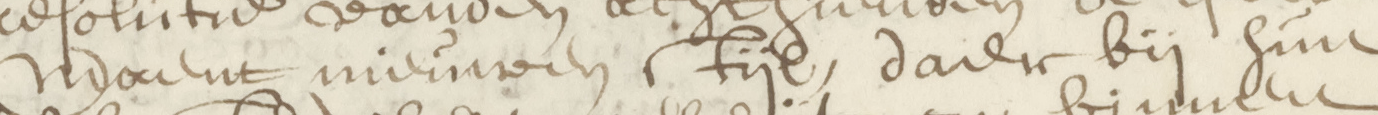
maent nieuwen stijl, daer bij hun
